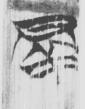羣
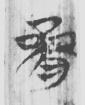{品宜}
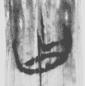曰
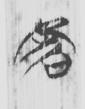害
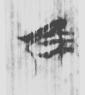隹
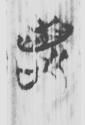若
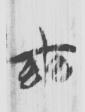𪪋
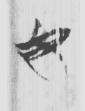母
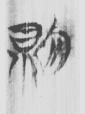則
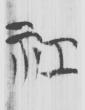{示工}
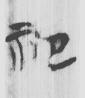祀
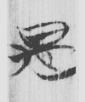是
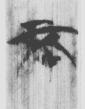不
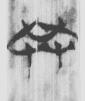共
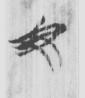母
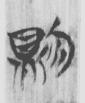則
